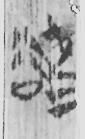欲
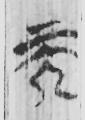而
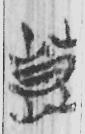莫
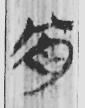{冖肉}
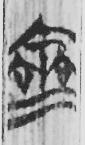齊
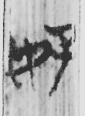好
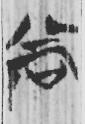尚
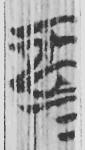亙止=
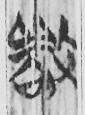敬
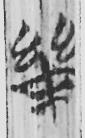𪪋（哉）
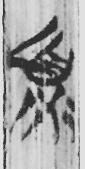寡
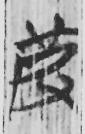皮
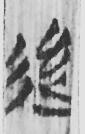○（後）
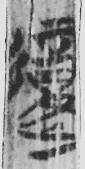復
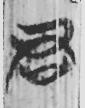君
